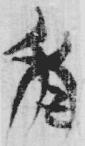年
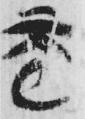而
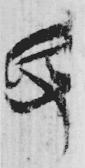民
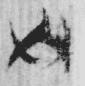夂（終）
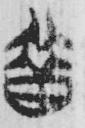昔
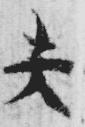○（堯）
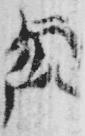凥（處）
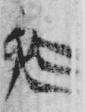於
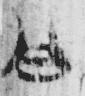丹
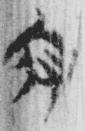府
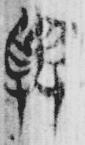與
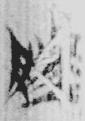陵
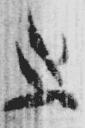之
